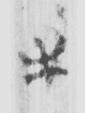牛
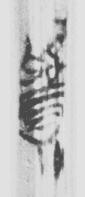{爲貝}
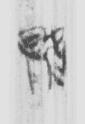資
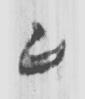㠯（以）
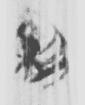利
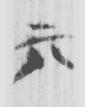亓
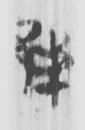邦
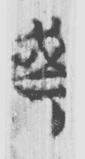國
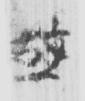或
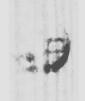曰
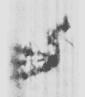此
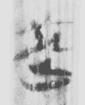武
